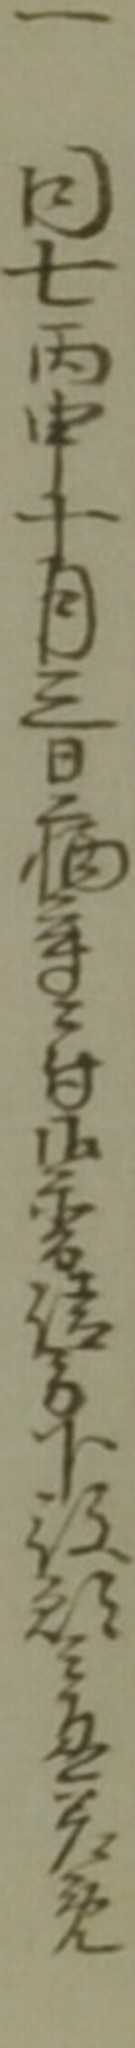一同七丙申十月三日病気ニ付御普請方下役願之通差免

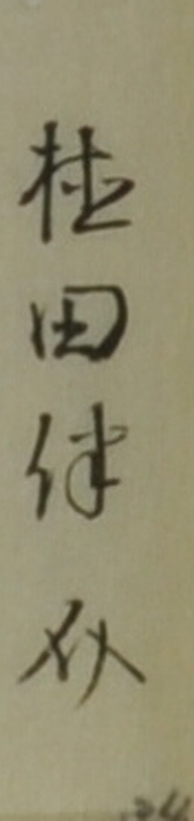植田伴介
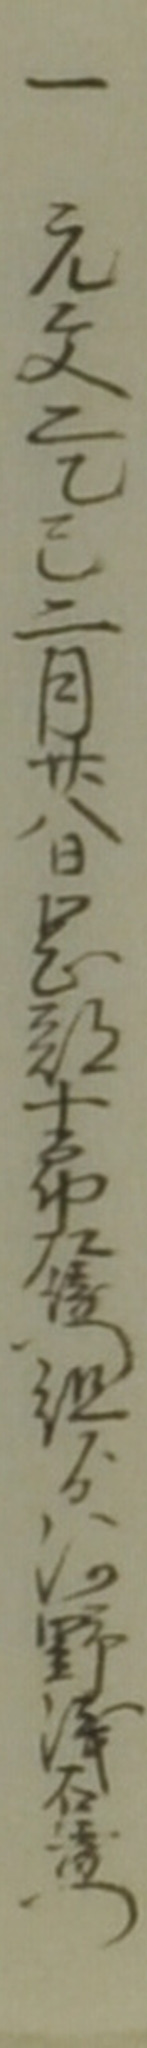一元文二乙巳二月廿八日岡部十郎左衛門組ゟ河野浅右衛門
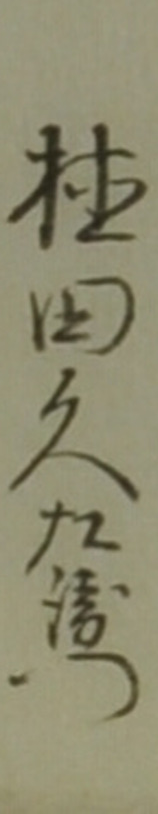植田久左衛門
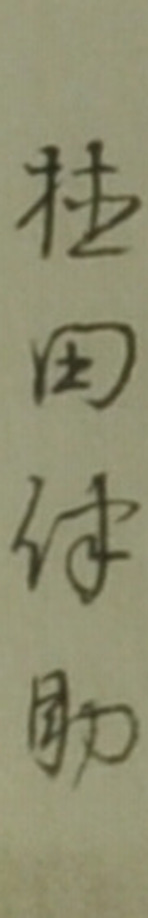植田伴助
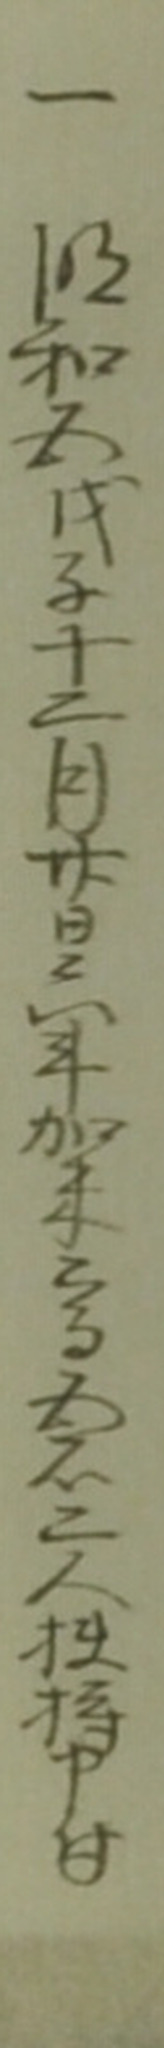一明和五戊子十二月廿日六斗加米高五石二人扶持申付

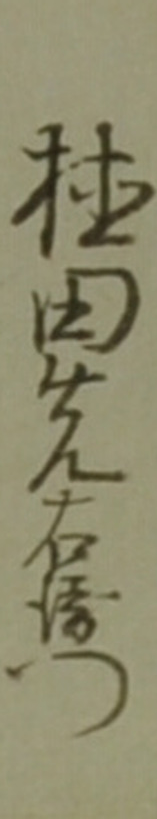植田先右衛門
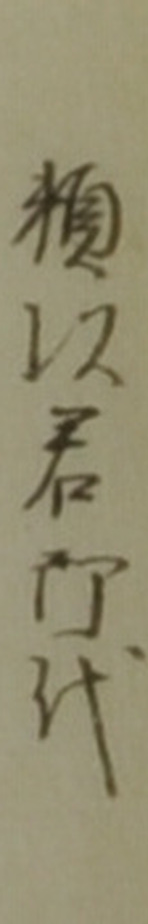頼以君御代
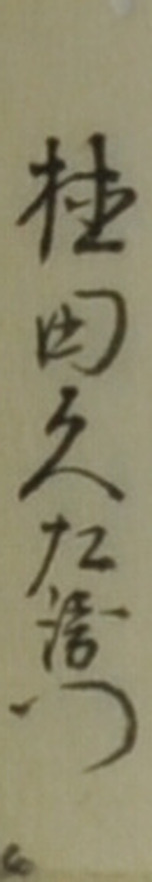植田久左衛門
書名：無足諸士勤仕録（八）
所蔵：伊那市立高遠町図書館・合同会社AMANE
